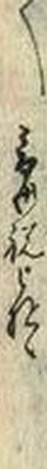ニ而御祝被遊候
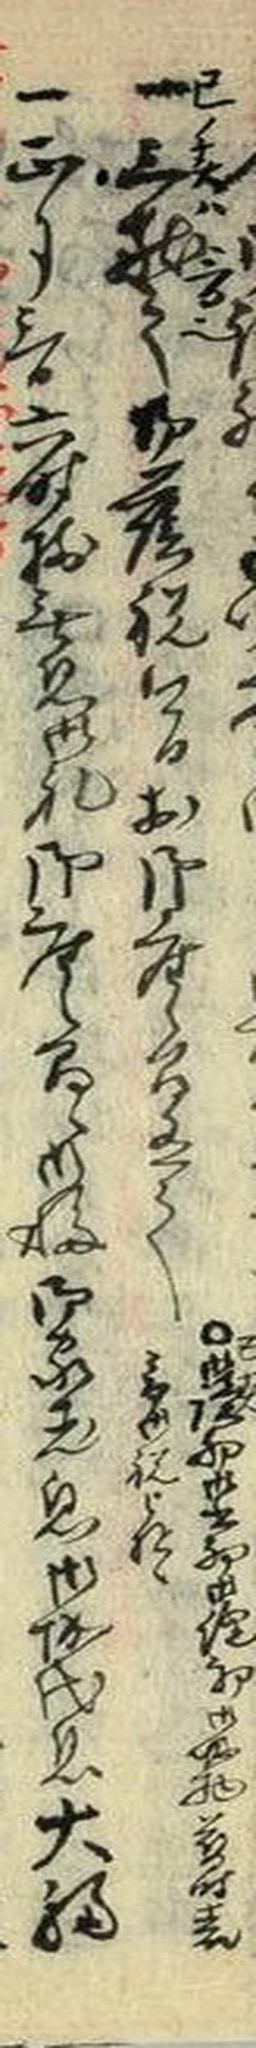一正月三日六時揃無息御礼御座之間へ御移御家老息御城代息大福
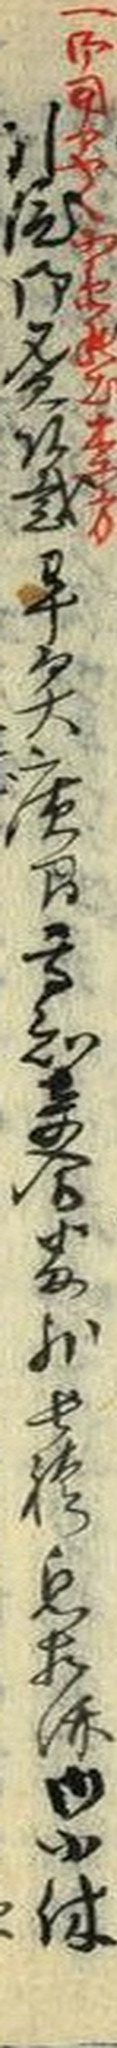引渡御盃頂戴畢而大広間高知寄合番外長袴息相済御小休
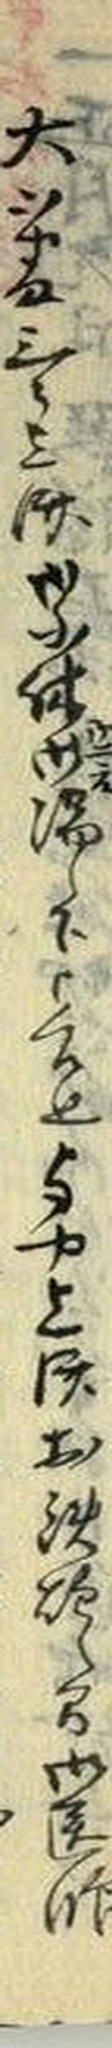大御番三同迄済御小休御二度御湯之下被召上与力迄済於鉄炮之間御医師
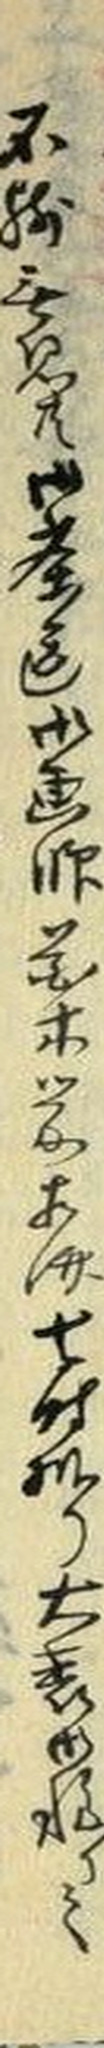不残無息共御茶道御画師花木栄相済七時掛り右表御移り之
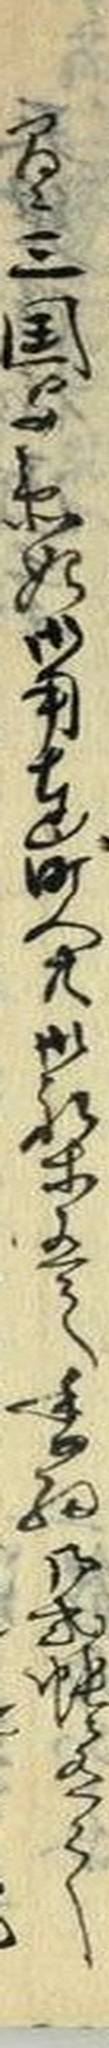間ニ三国与兵衛始御用達町人共御礼等有之委細御式帳ニ有之
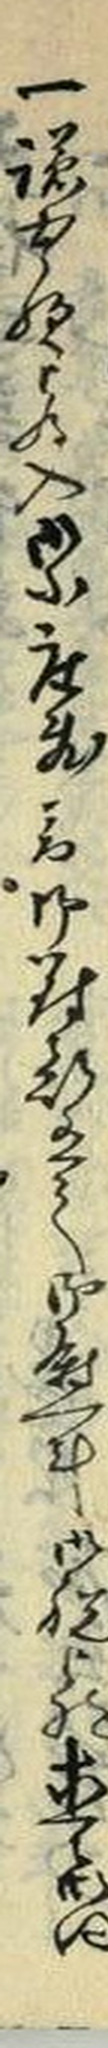一謙五郎様被為入御小座敷ニ而御対顔有之御熨斗御祝被遊直ニ御同
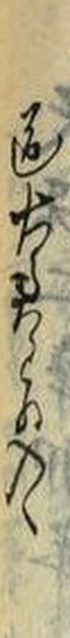道大奥へ被為入候
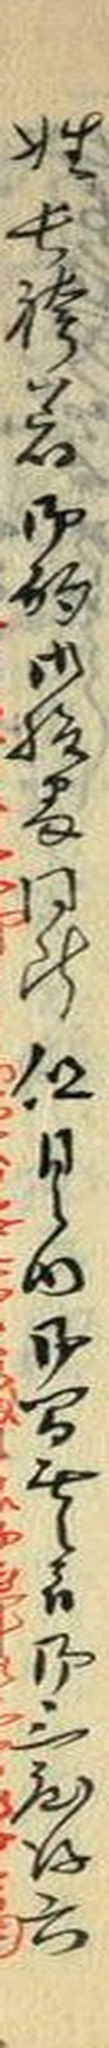姓長袴着御酌御膳番同断但日之内御間無之ニ付御三度後六
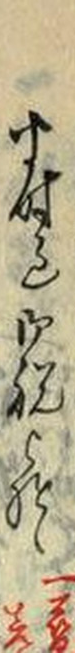半時過御祝被遊候
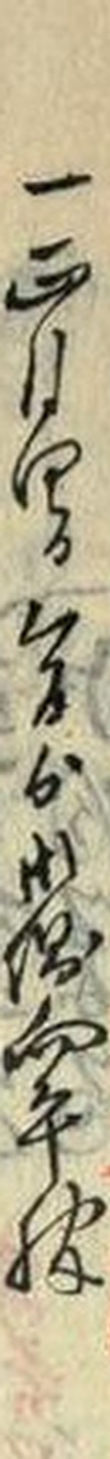一正月四日今日ゟ御側向平服
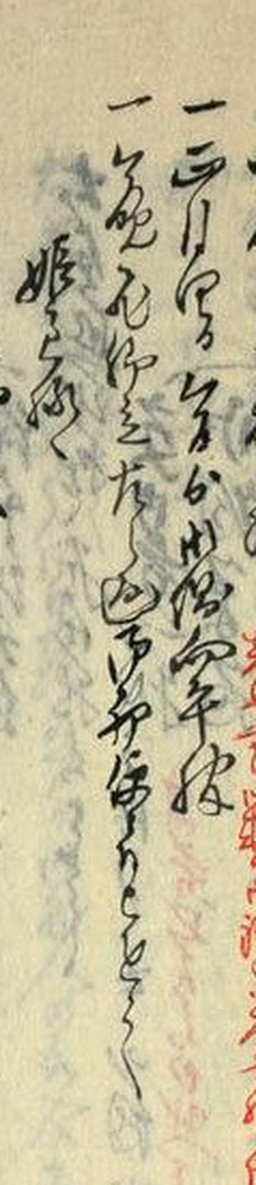一今晩飛脚立左之通御初便ニ付被進之
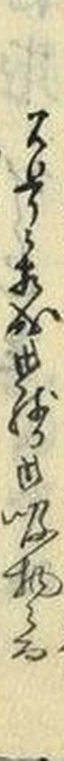召上りニ相成御残り御吸物ニ而
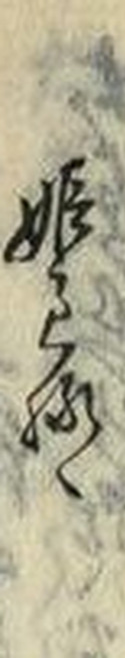姫君様へ
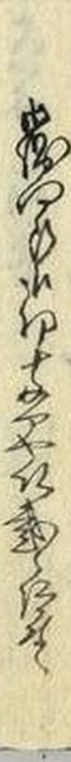御側向頭両部や頂戴被仰付候
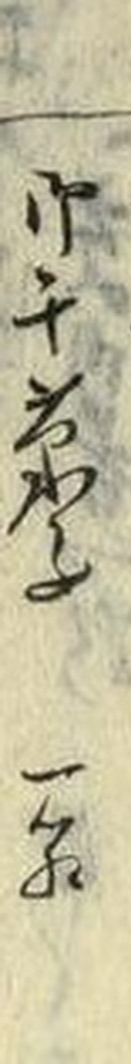御干菓子一箱
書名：少傅日録抄（斉承付側向頭取日記、在国）
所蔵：福井県文書館 Fukui Prefectural Archives
